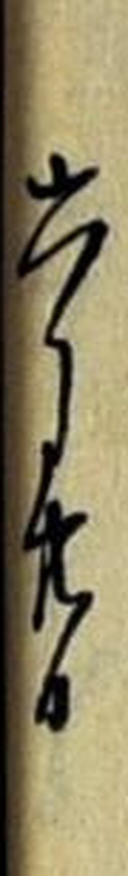六月廿日
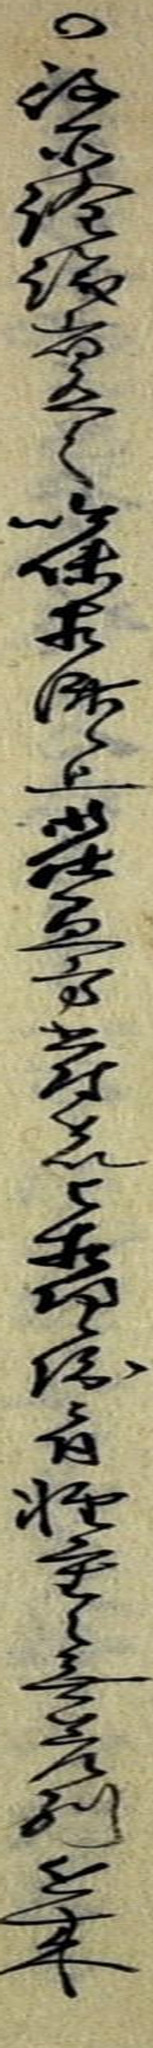〇役所詮議者有之吟味相済候上御仕置方書付を以被相伺候儀ニ付軽重之無差別近来
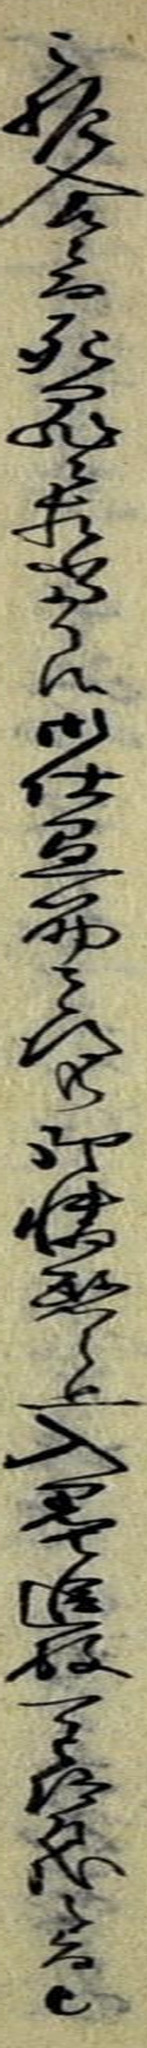之振合ニ而死罪ニ相当り候御仕置筋ニ候得共御憐愍之上入墨追放可被仰付哉之旨被
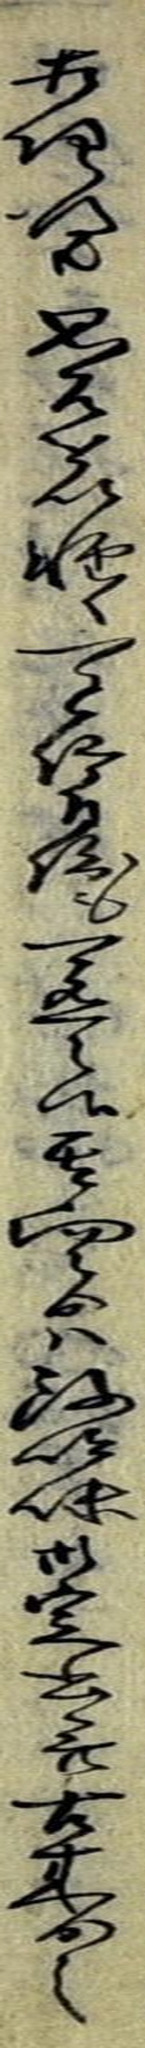相伺候得共思召を以軽く可被仰付儀も可有之候其向々ゟハ致吟味御定書并古来ゟ之
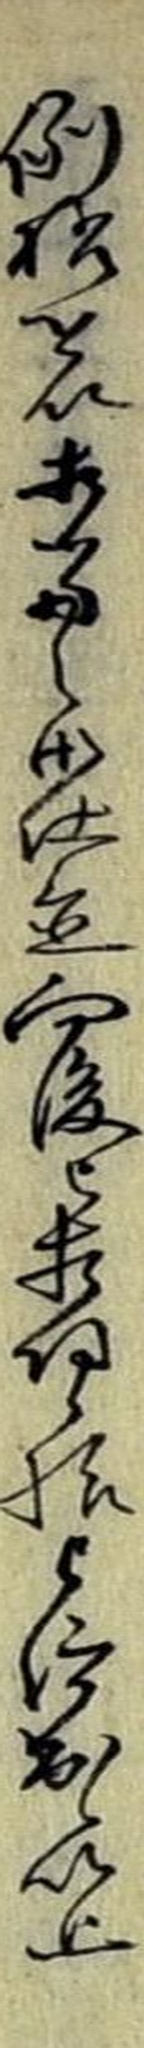例格を以相当之御仕置向後被相伺候様被仰出候以上
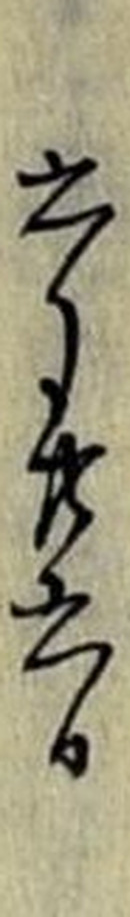六月廿六日
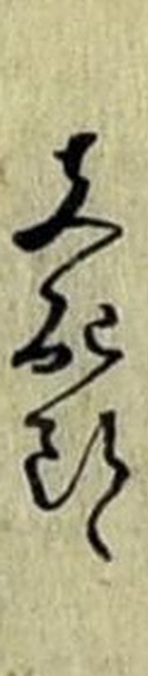支配頭へ
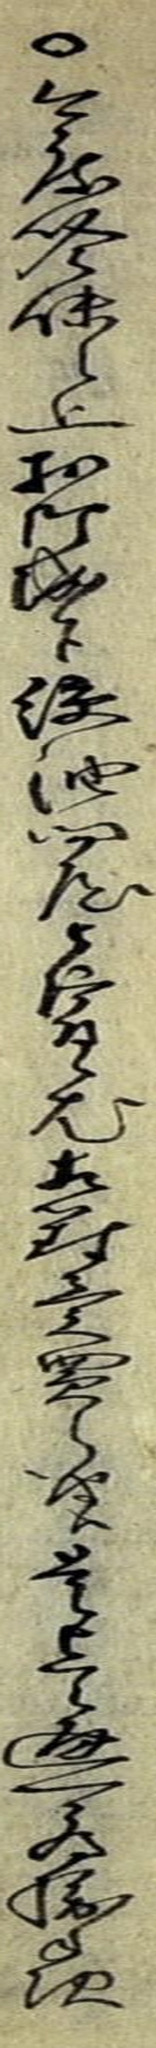〇今度吟味之上於御城下絞油問屋被仰付候尤相対売買之儀ハ是迄之通可為勝手次
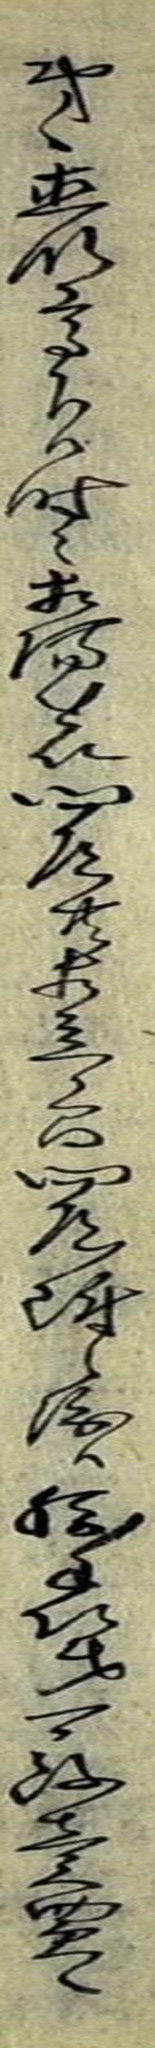第候直段高下ハ時之相場を以問屋共相立候間問屋付之儀ハ勝手次第可致売買候
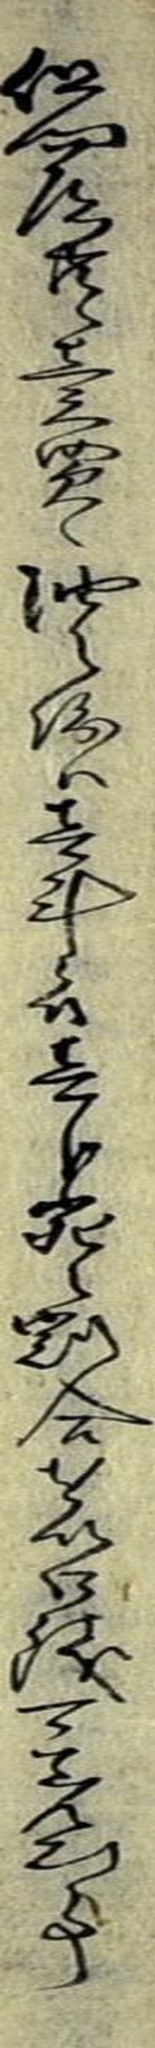但問屋共へ売買候油之儀ハ壱斗ニ付壱歩宛之割合を以口銭可差出事
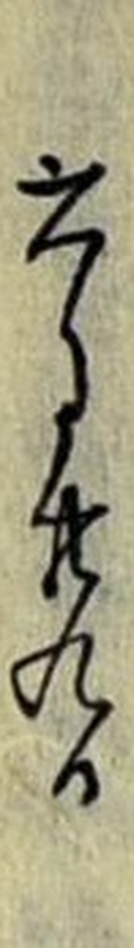六月廿九日
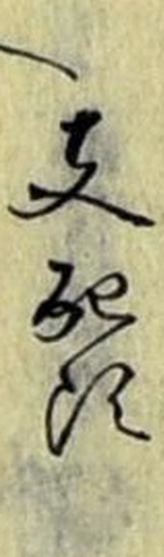支配頭

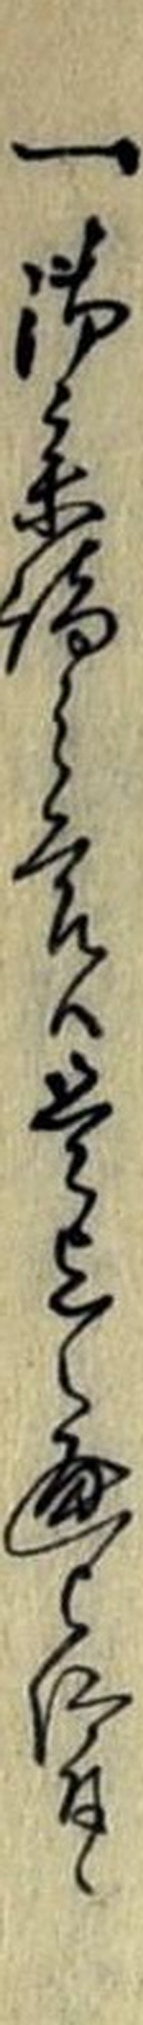一御参詣之節ハ是迄之通被仰付候
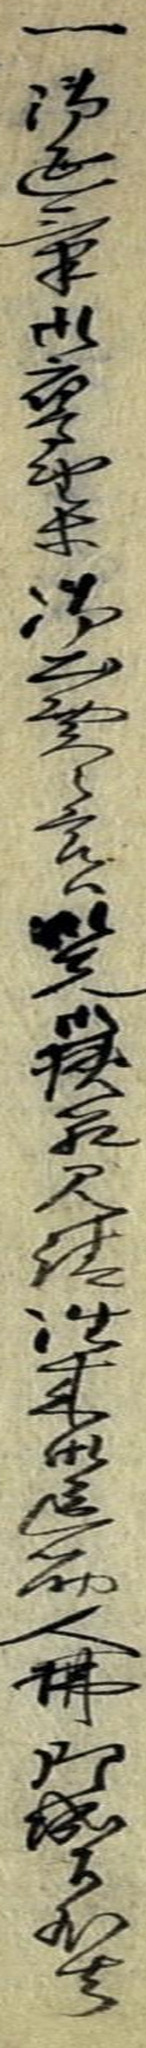一御延気御鷹野等御出殿之節ハ御先御挟箱見請往来御道筋人払御城下外者
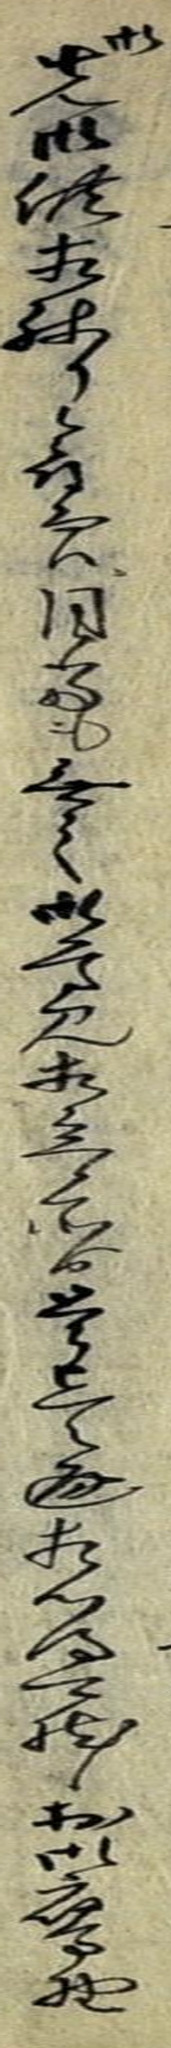御先御供相残り候ニ付而ハ目当も無之御鳥見相立候所ゟ是迄之通相心得可然候於御鷹野
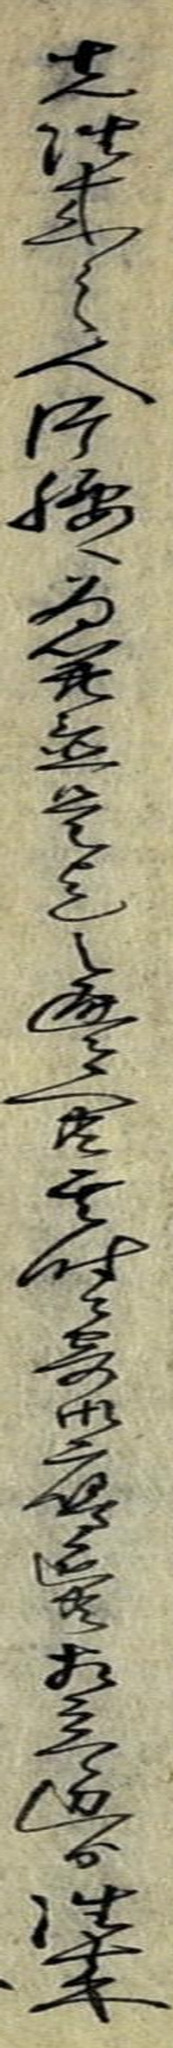先往来之人片腰へ為開置是迄之通ニ候へ共其時ニ寄御鷹匠共相立候辺ゟ往来
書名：命令之部 三
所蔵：福井県文書館 Fukui Prefectural Archives
